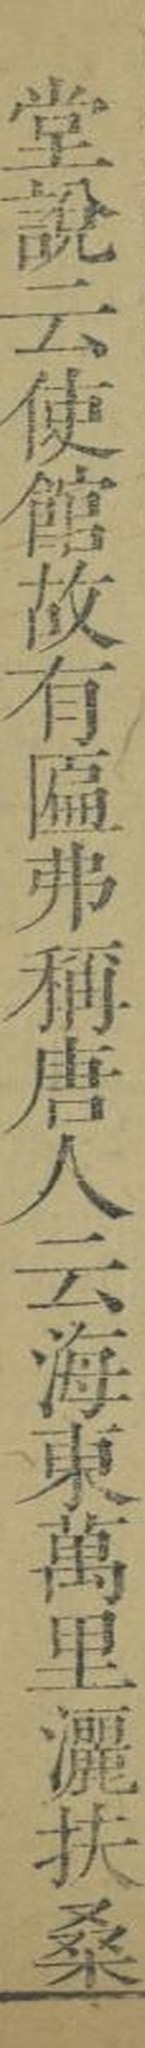堂說云使館故有匾弗稱唐人云海東萬里灑扶桑
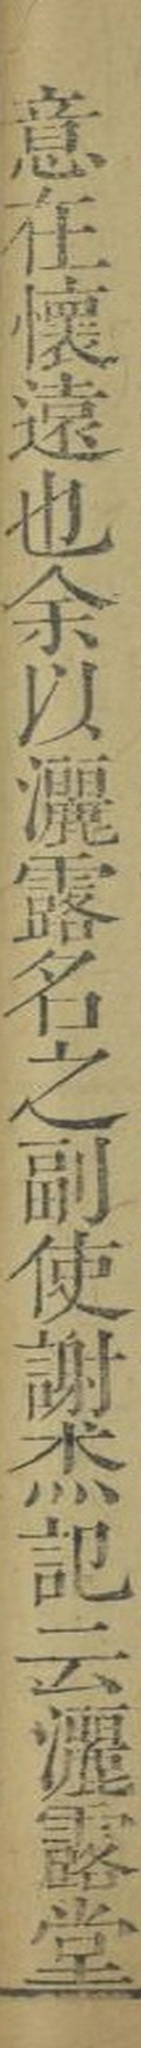意在懷遠也余以灑露名之副使謝杰記云灑露堂
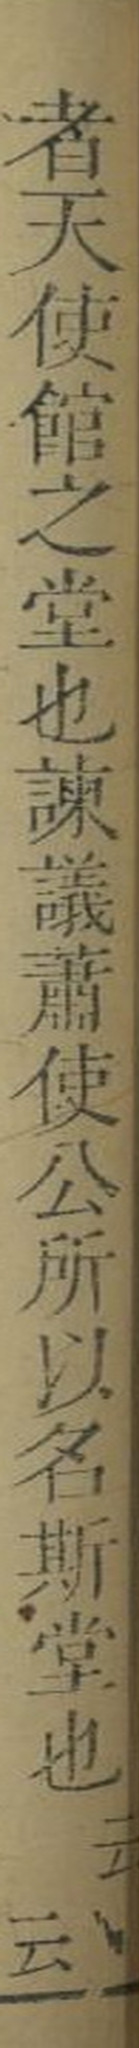者天使館之堂也諫議蕭使公所以名斯堂也云云
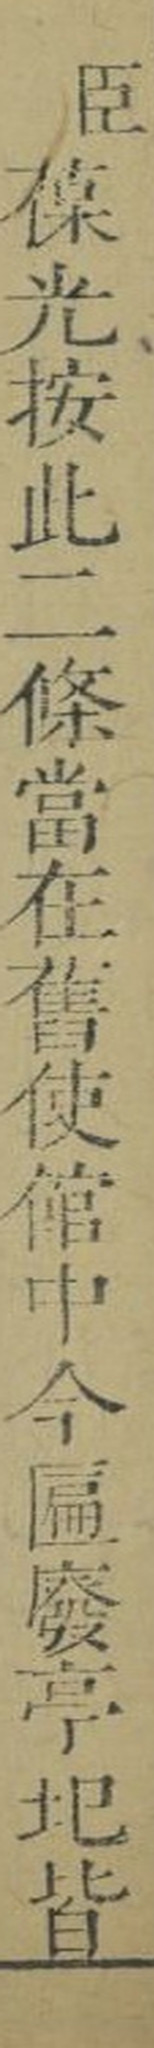臣葆光按此二條當在舊使館中今匾廢亭圯皆
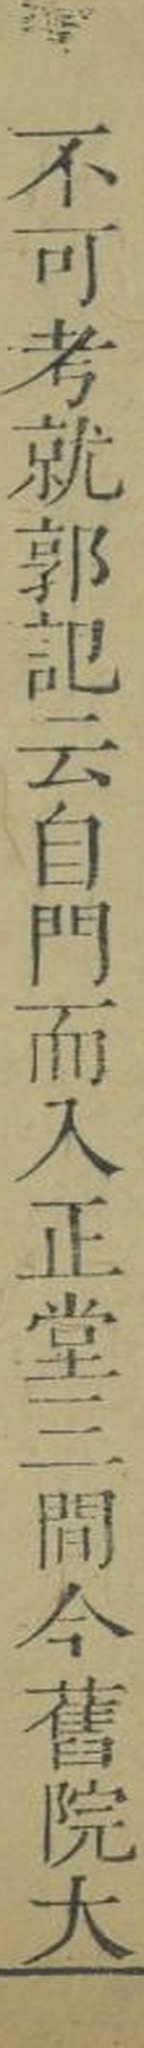不可考就郭記云自門而入正堂三間今舊院大
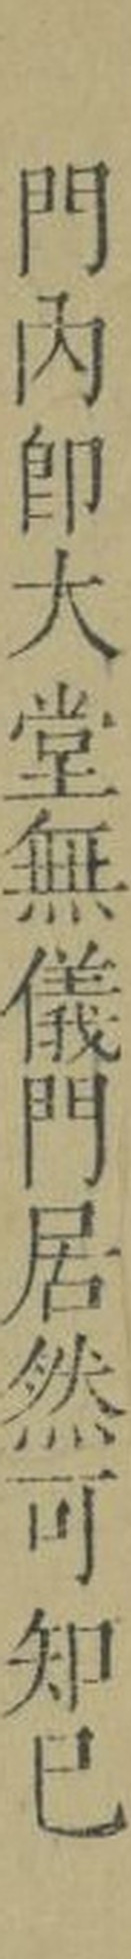門内卽大堂無儀門居然可知巳
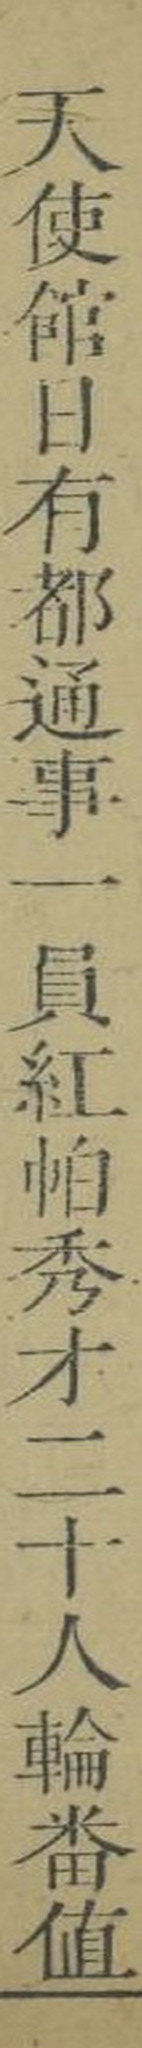天使館日有都通事一員紅帕秀才二十人輪畨値
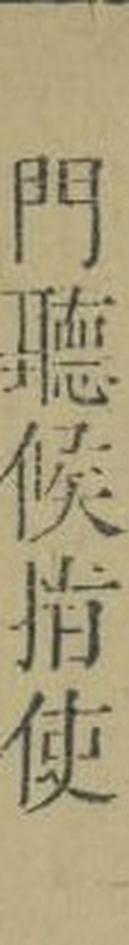門聽候指使
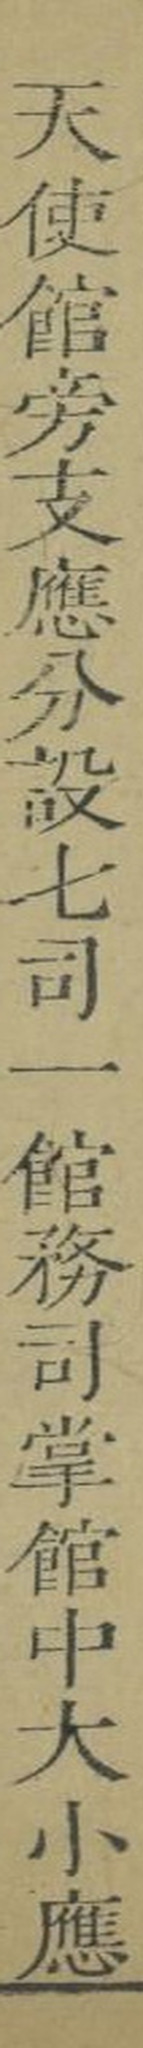天使館旁支應分設七司一館務司掌館中大小應
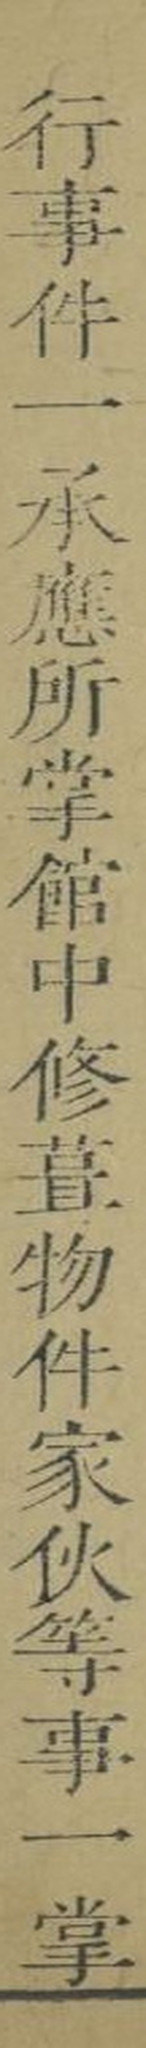行事件一承應所掌館中修葺物件家伙等事一掌
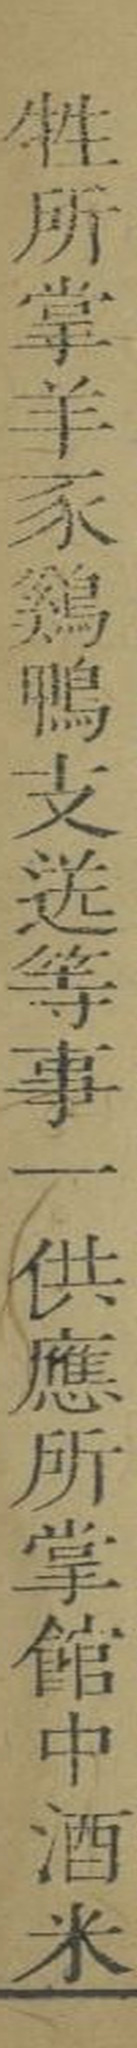牲所掌羊豕鷄鴨支送等事一供應所掌館中酒米

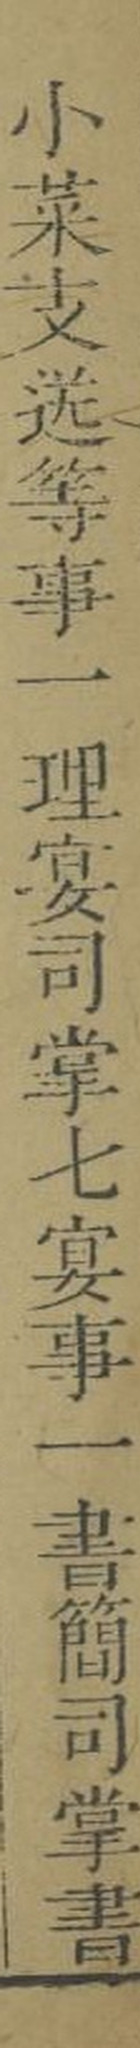小菜支送等事一理宴司掌七宴事一書簡司掌書
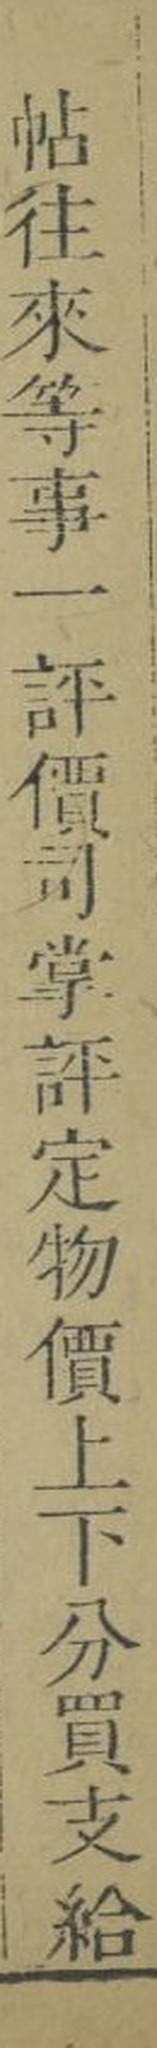帖往來等事一評價司掌評定物價上下分買支給
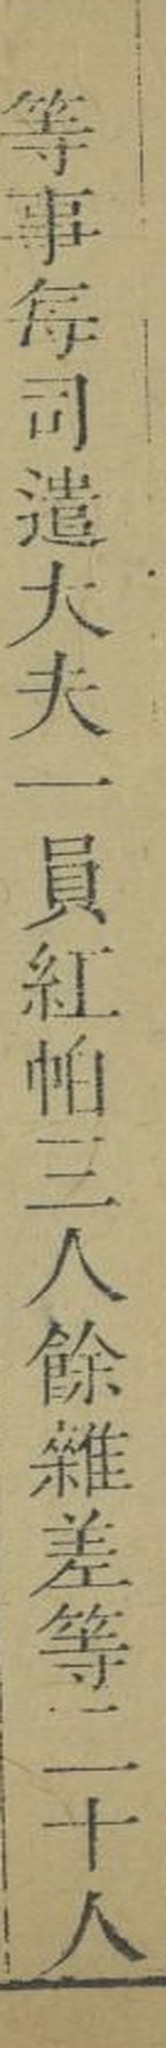等事每司遣大夫一員紅帕三人餘雜差等二十人
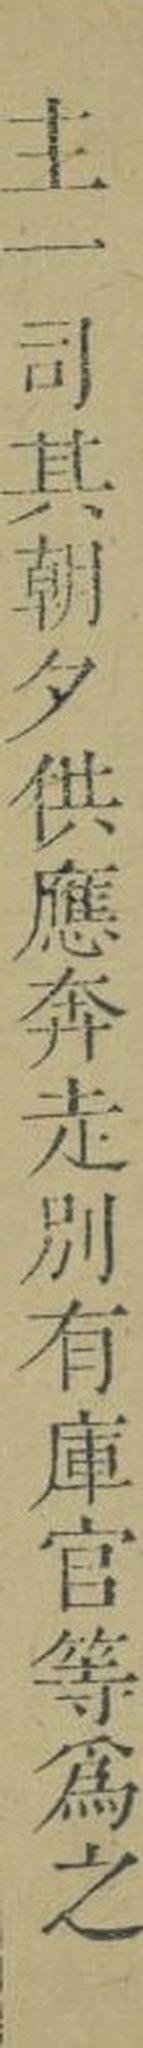主一司其朝夕供應奔走別有庫官等爲之
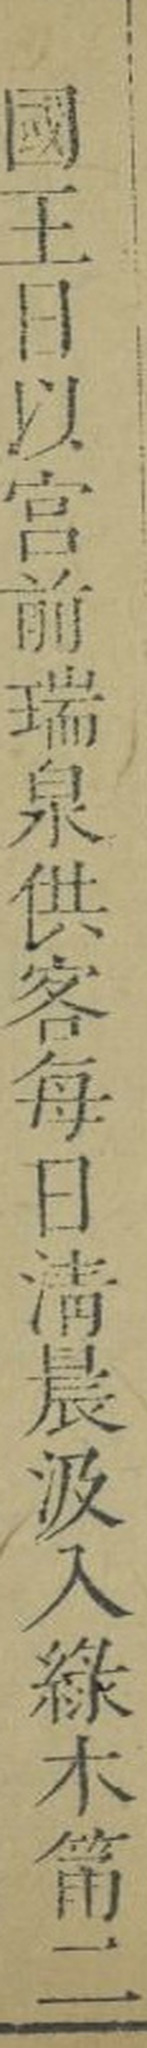國王日以宫前瑞泉供客每日淸晨汲入綠木筩二
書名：中山伝信録 巻二
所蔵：University of the Ryukyus Library
